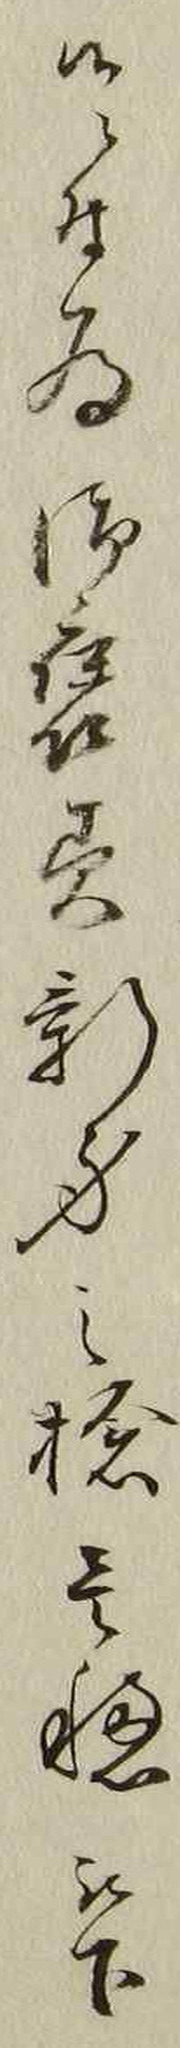候ニ付為御褒美新身之槍壱穂被下
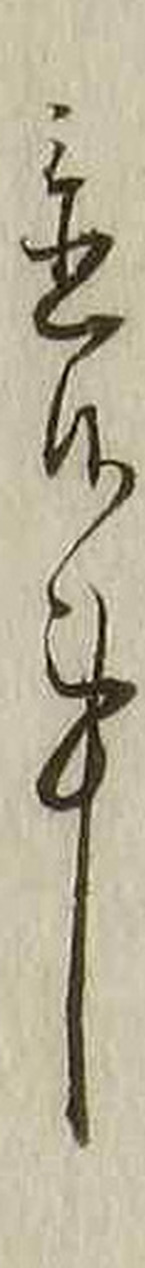置候事
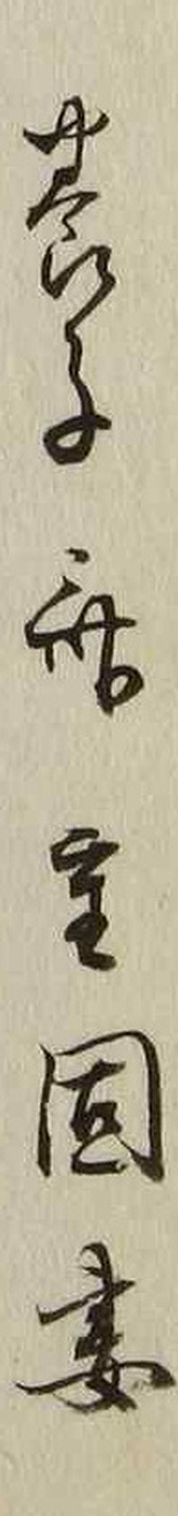女養子斎重固妻
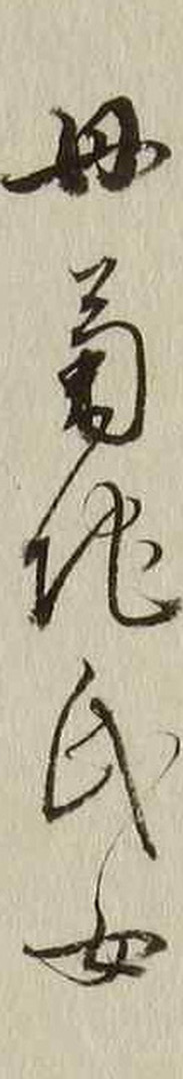母菊地氏女
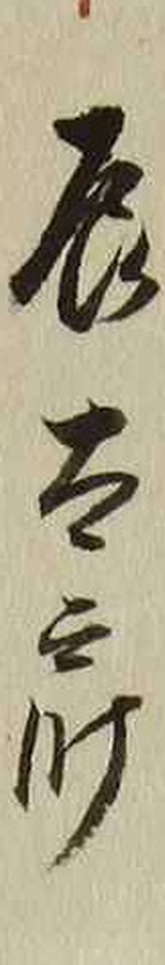辰太郎
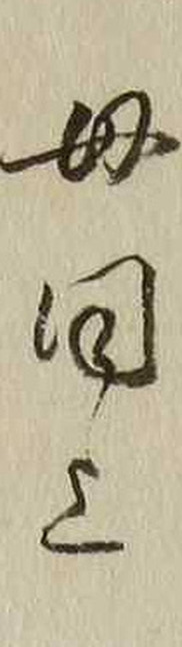母同上
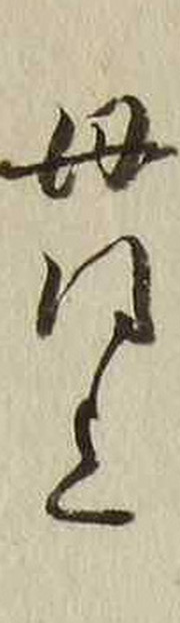母同上
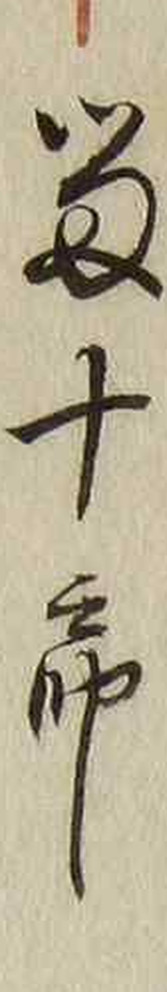留十郎
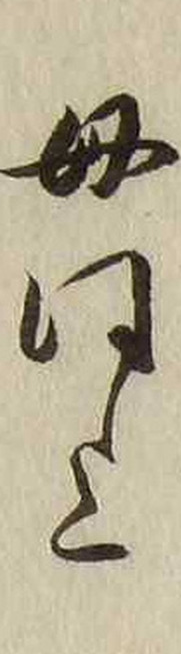母同上

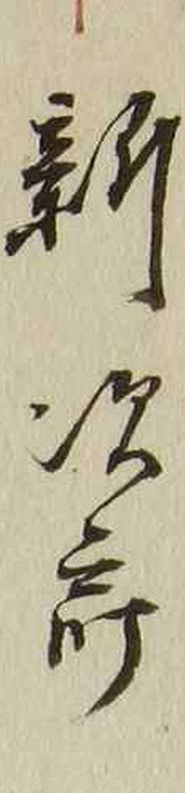新次郎
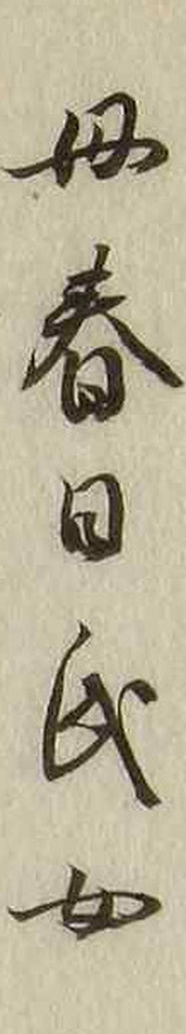母春日氏女
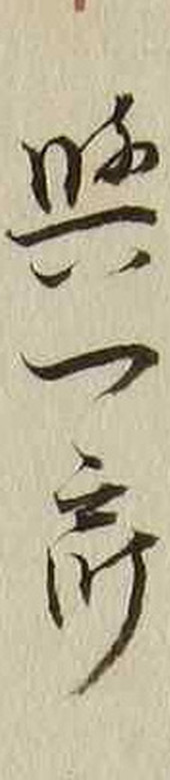与一郎
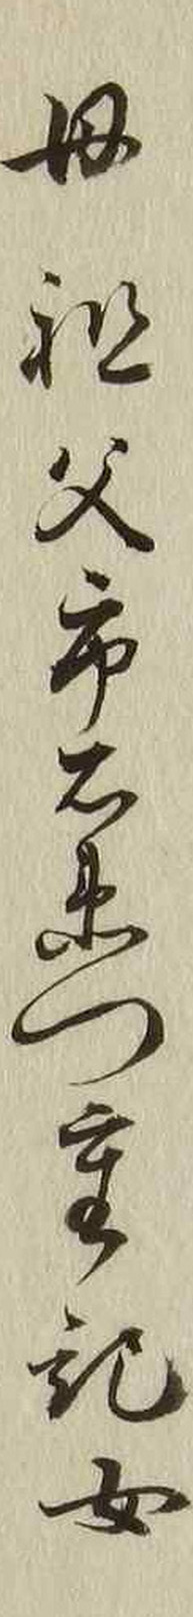母祖父市右衛門重記女
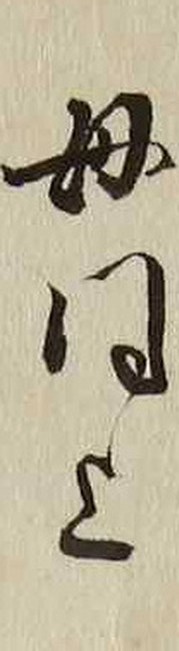母同上
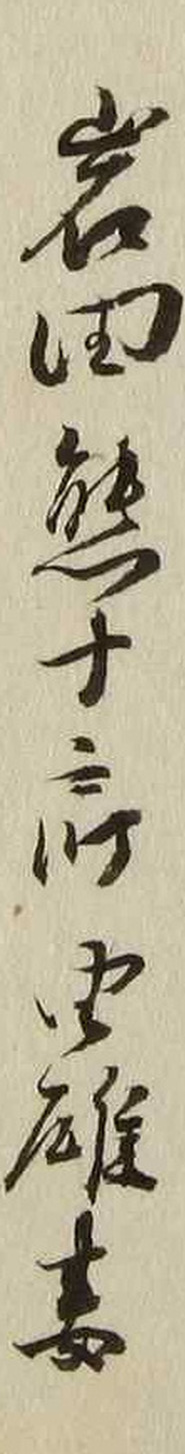女岩田熊十郎由雄妻
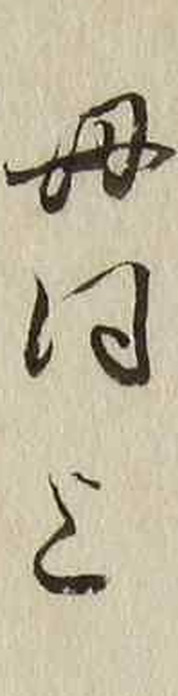母同上
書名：諸士系譜　巻之26　い之部26
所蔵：会津若松市立会津図書館
